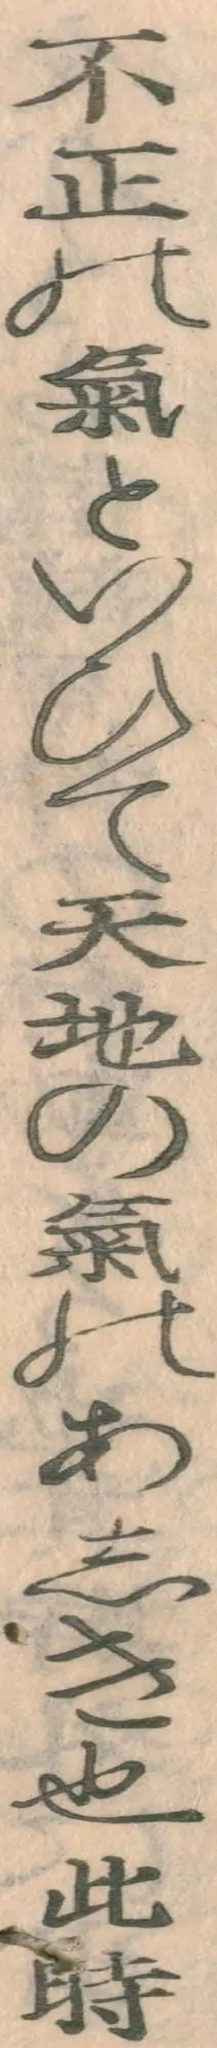不正の気といひて天地の気のあしき也此時
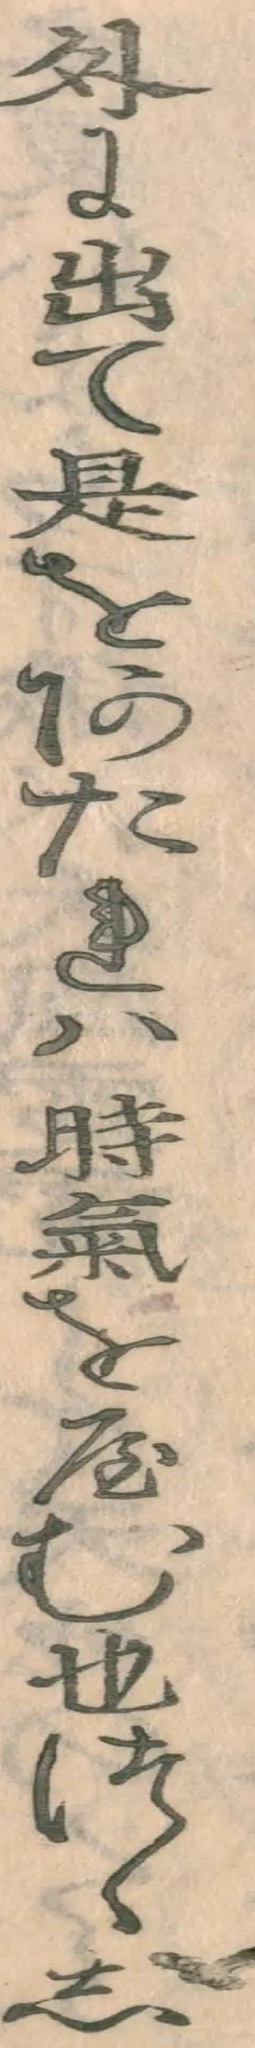外に出て是をあたれは時気をやむ也つゝし
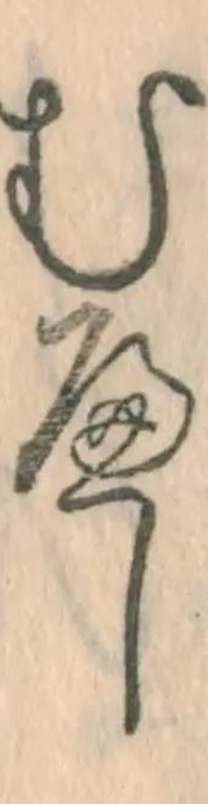むへし
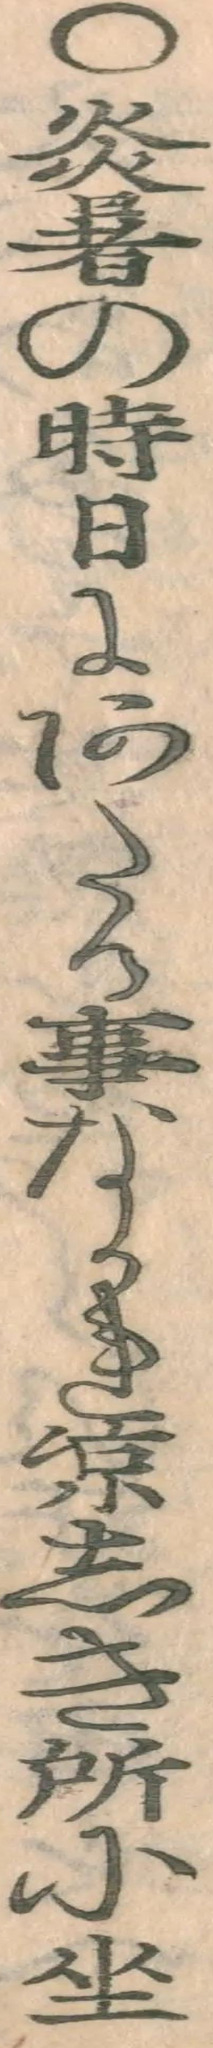〇炎暑の時日にあたる事なかれ涼しき所に坐
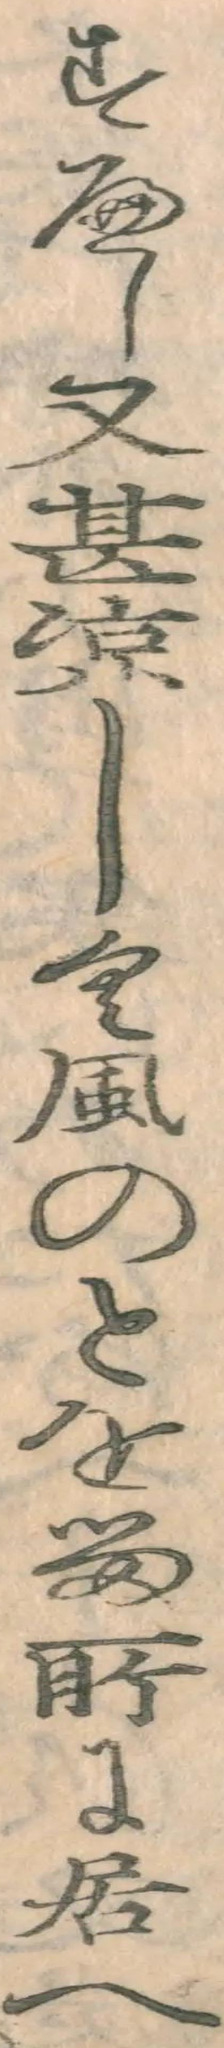すへし又甚涼しく風のとをる所に居へ

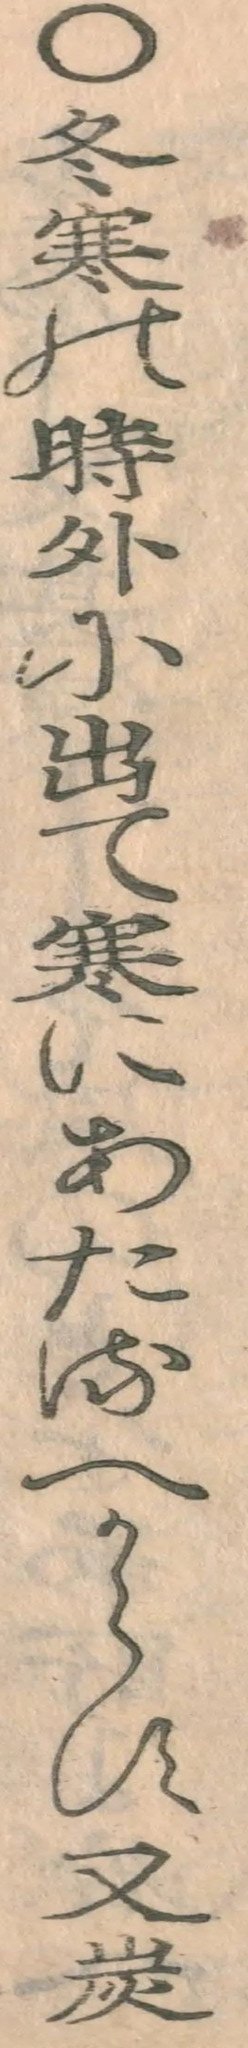〇冬寒の時外に出て寒にあたるへからす又炭
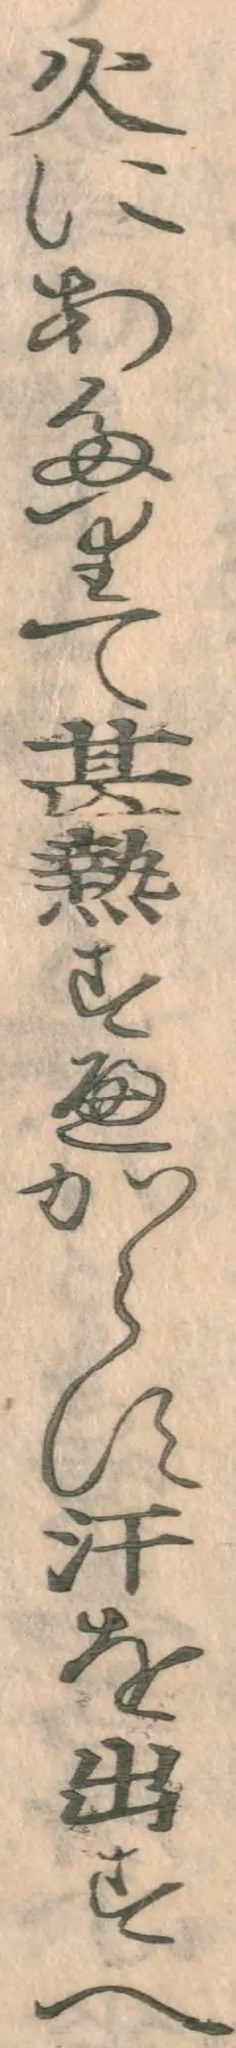火にあたりて甚熱すへからす汗を出すへ
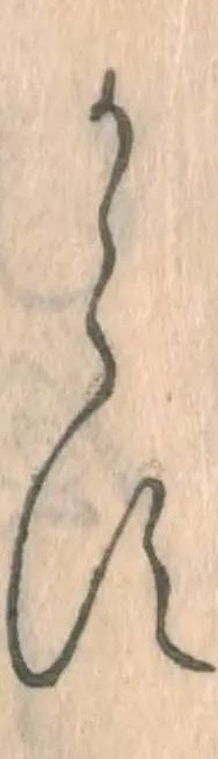からす
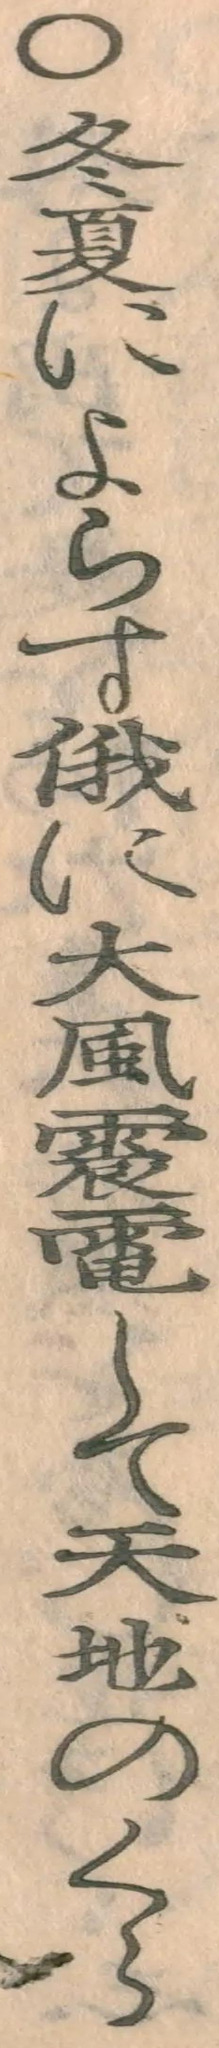〇冬夏によらす俄に大風震電して天地のくら
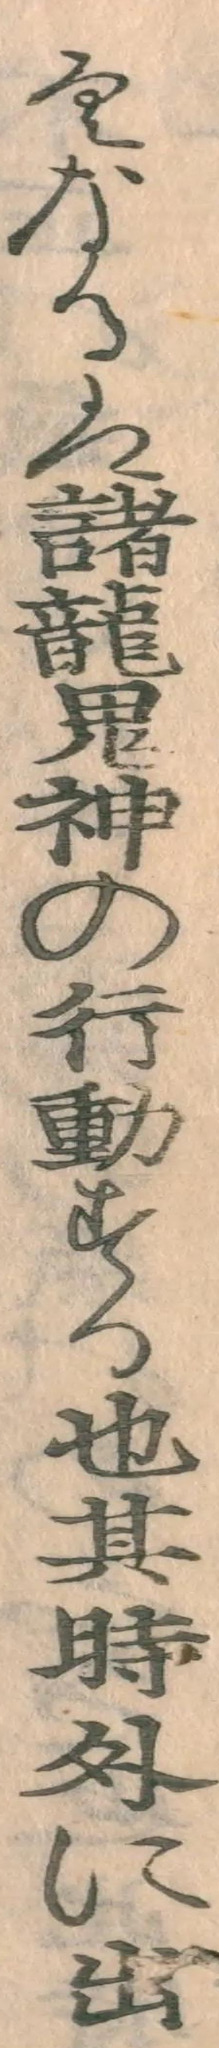くなるは諸竜鬼神の行動する也其時外に出
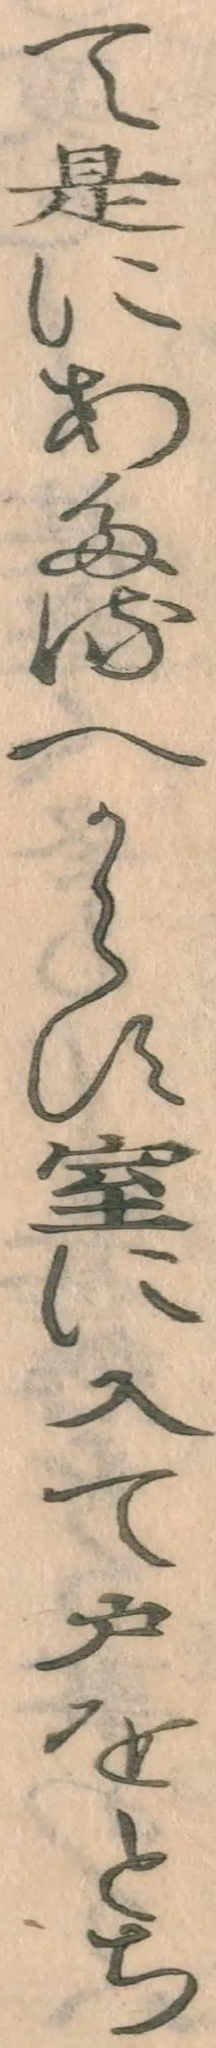て是にあたるへからす室に入て戸をとち
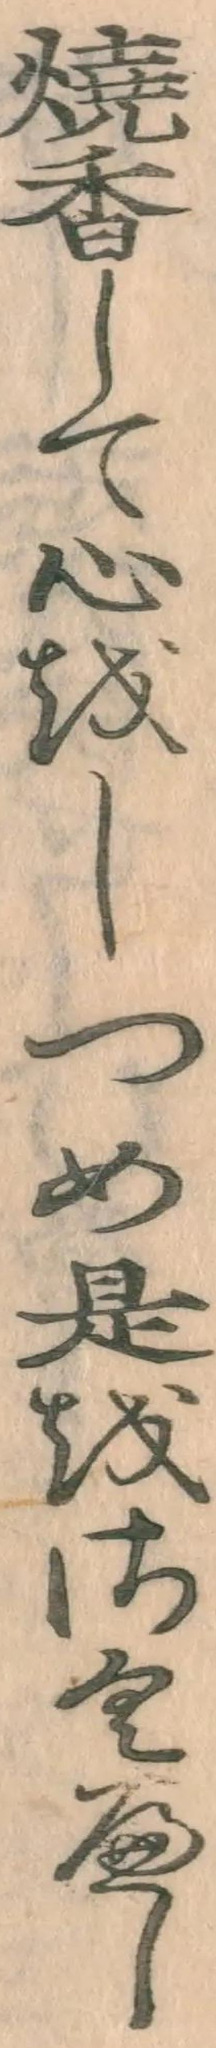焼香して心をしつめ是をさくへし
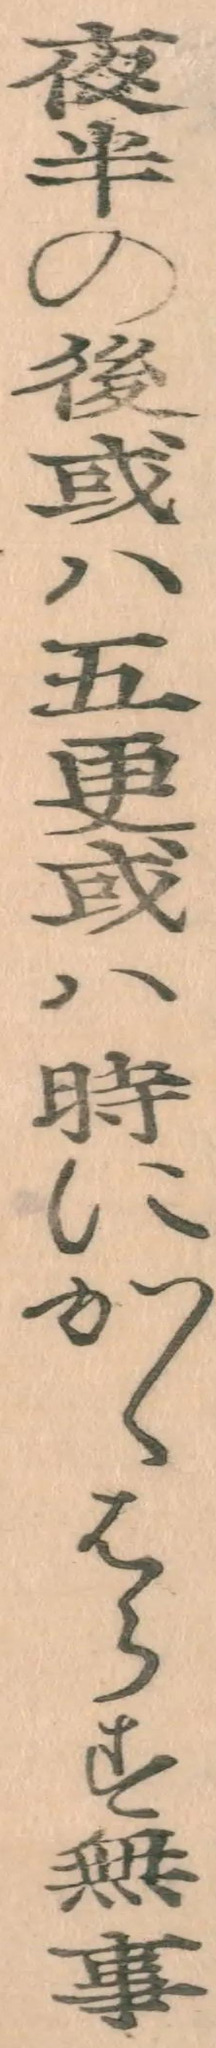夜半の後或は五更或は時にかゝはらす無事
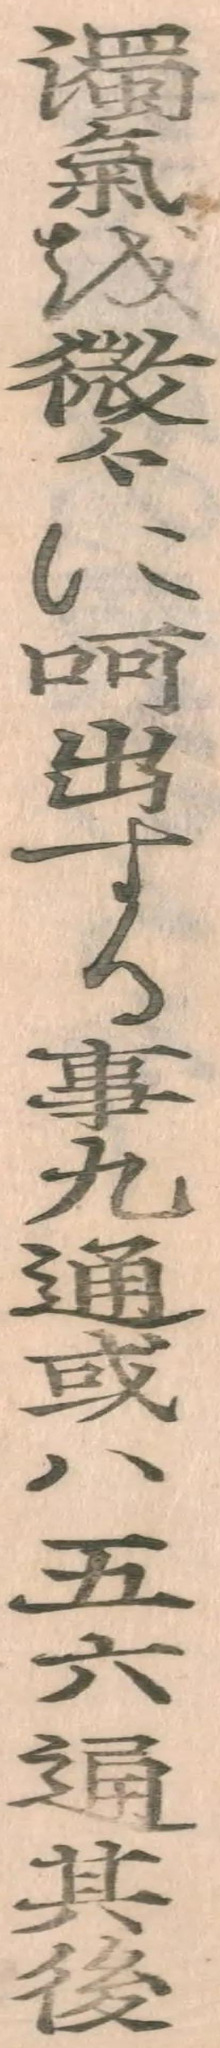濁気を微々に呵出する事九通或は五六通其後
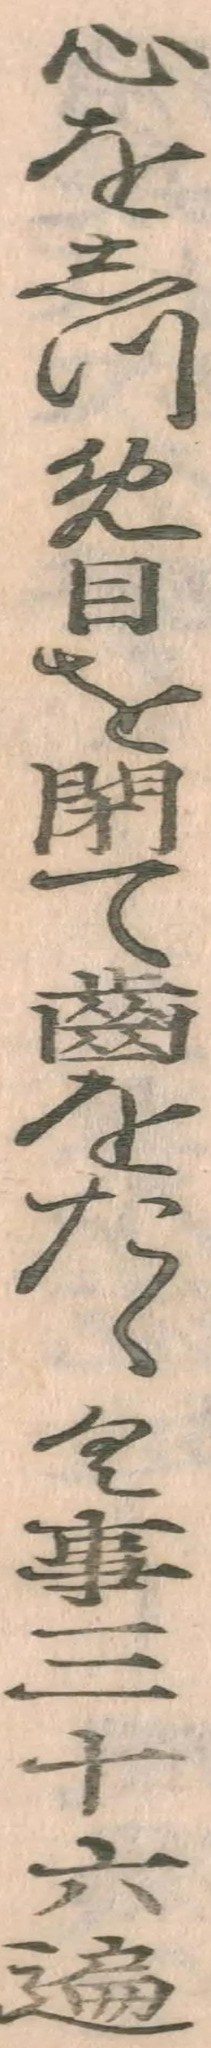心をしつめ目を閉て歯をたゝく事三十六遍
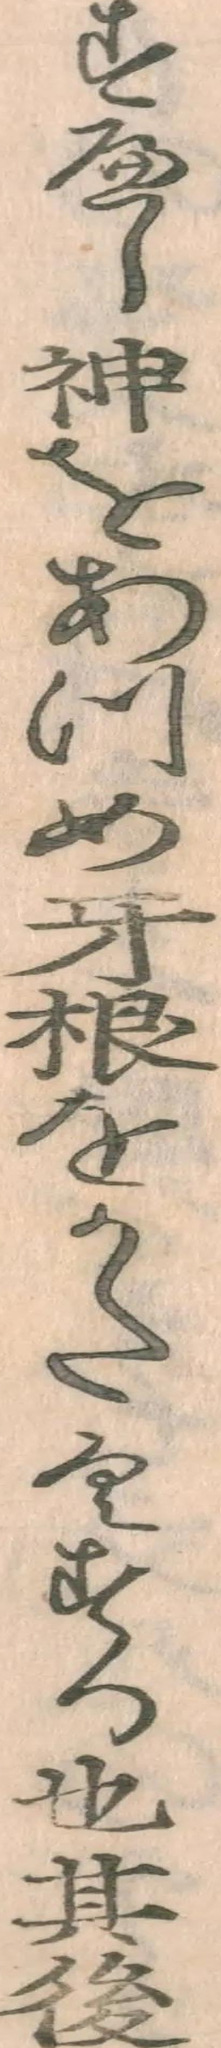すへし神をあつめ牙根をかたくする也其後
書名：延壽撮要
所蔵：国立国会図書館 National Diet Library, JAPAN
